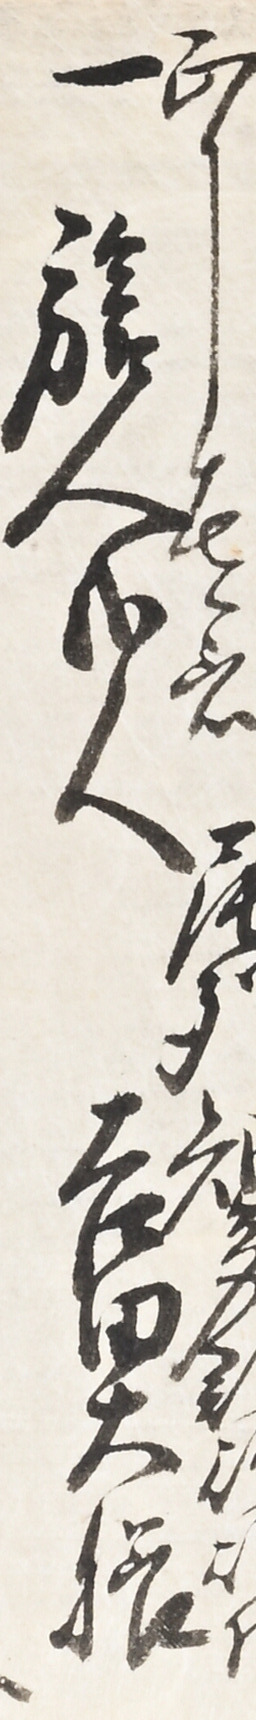一旅人弐人吉田大膳
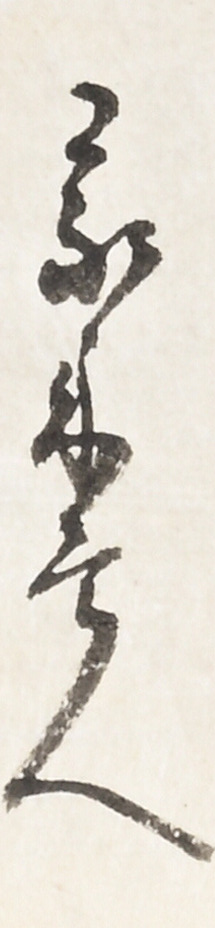家来壱人
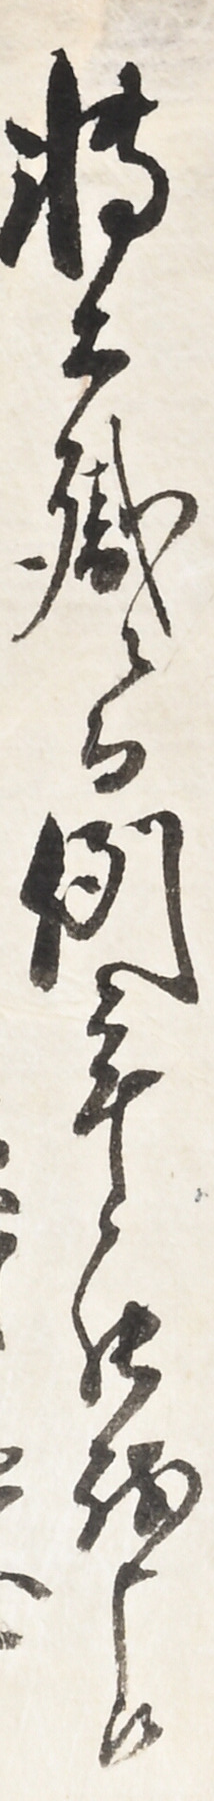転士職ニ而例年罷越申候
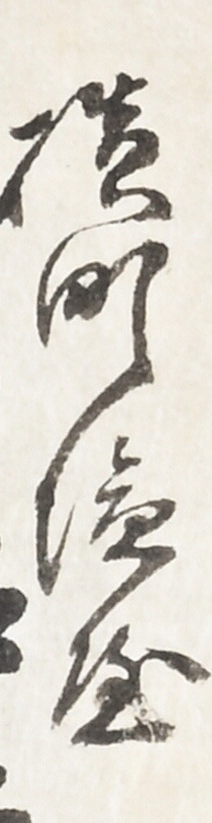横町塩屋
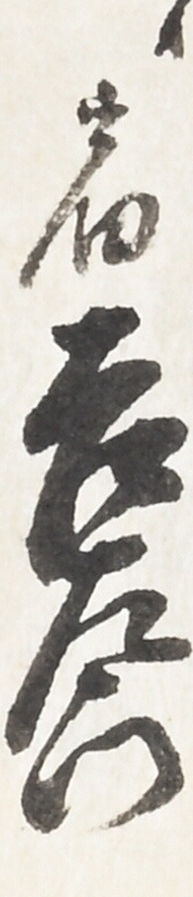宿吉左衛門
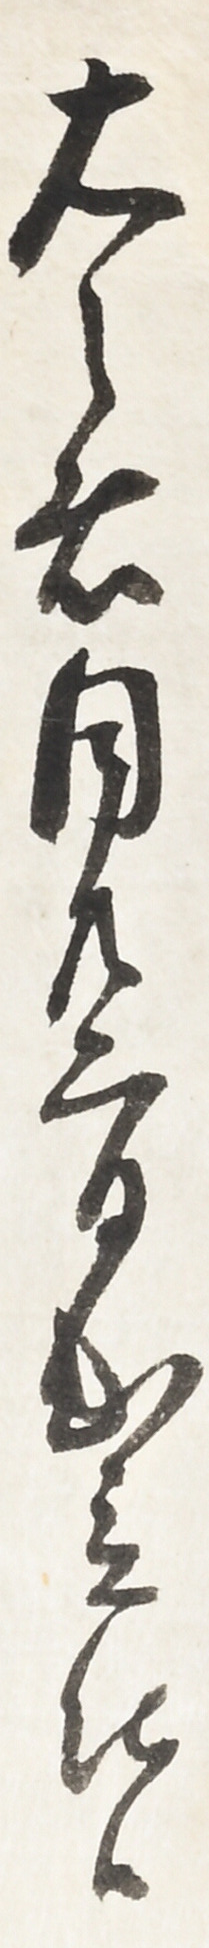右之者同廿二日出立仕候
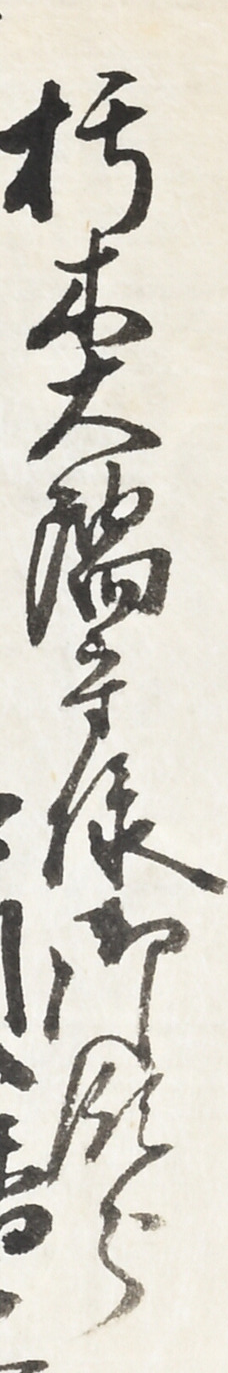朽木大隅守様御領分
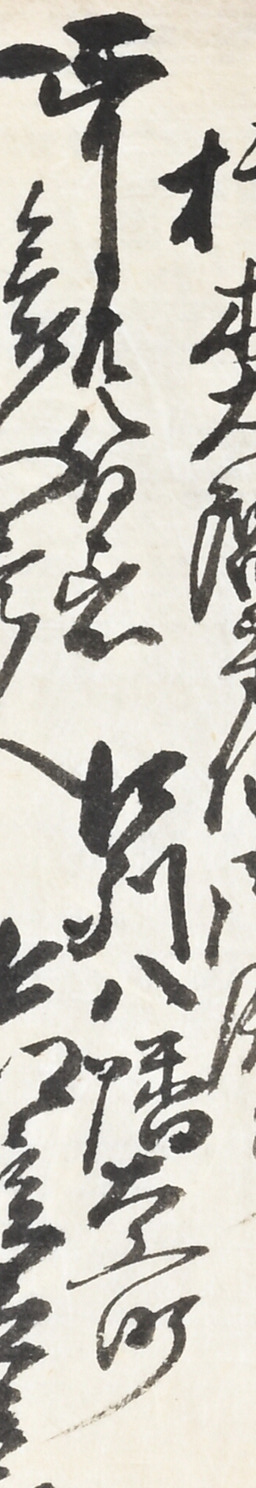正月廿八日着江州八幡大工町
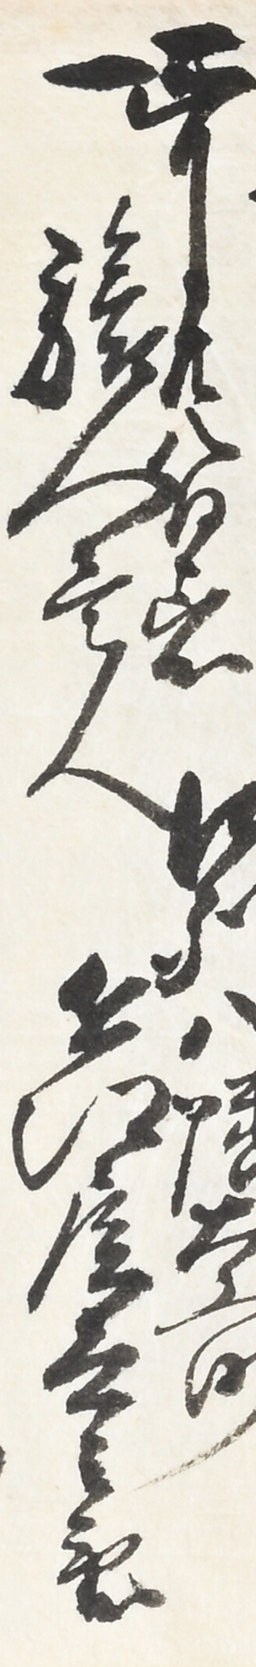一旅人壱人近江屋太兵衛
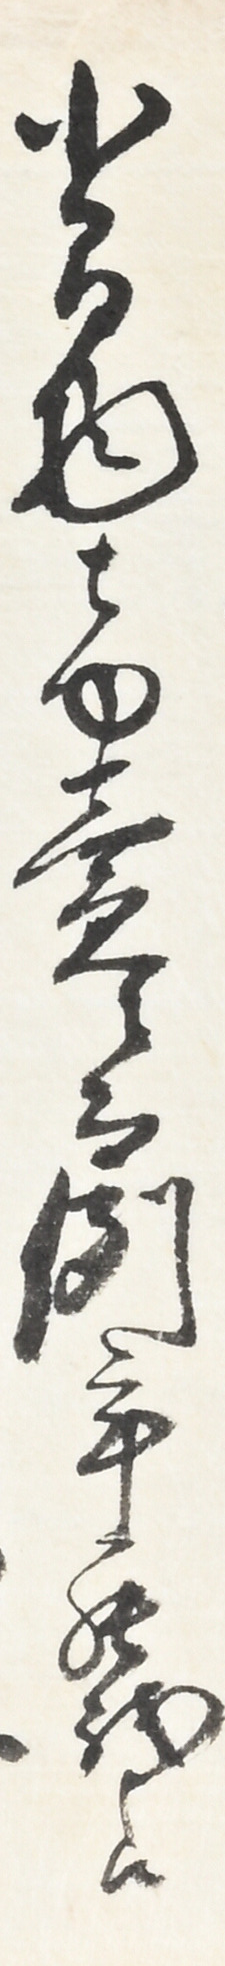小間物商売ニ而例年罷越申候
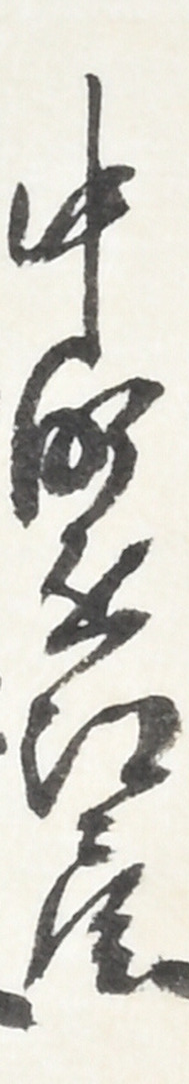中町近江屋
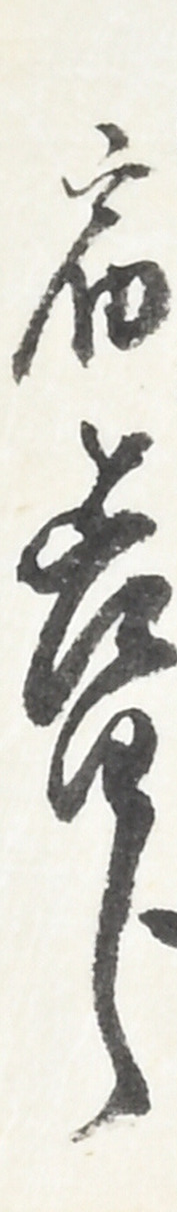宿善四郎

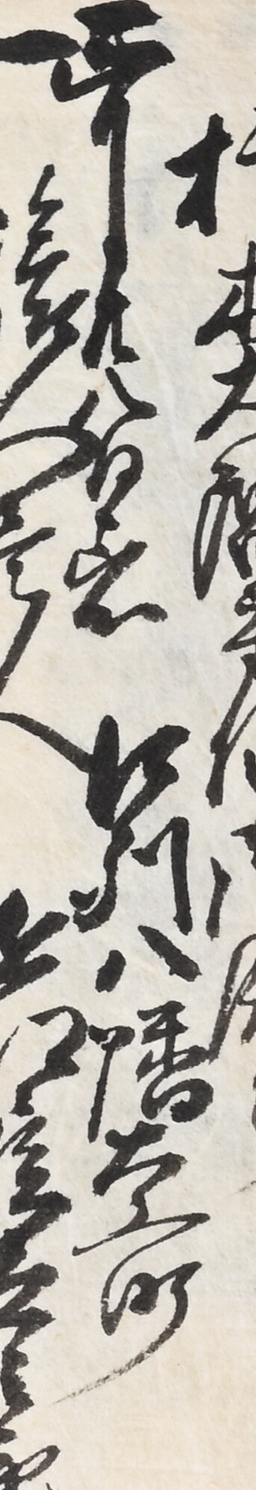正月書上之内江州八幡大工町
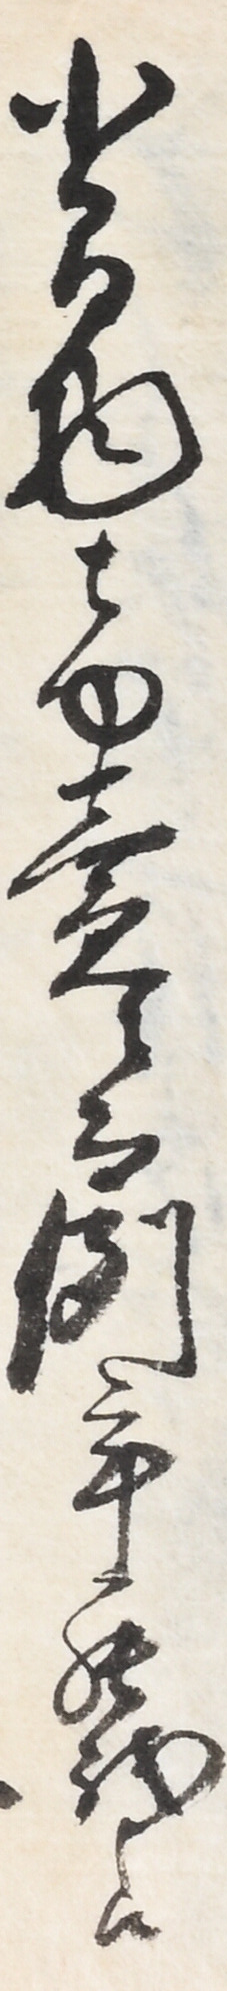油商売ニ而例年罷越申候
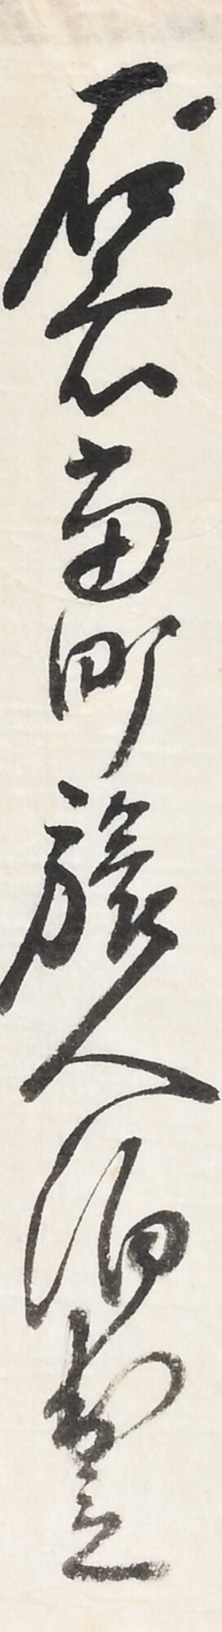右者当町旅人泊出立
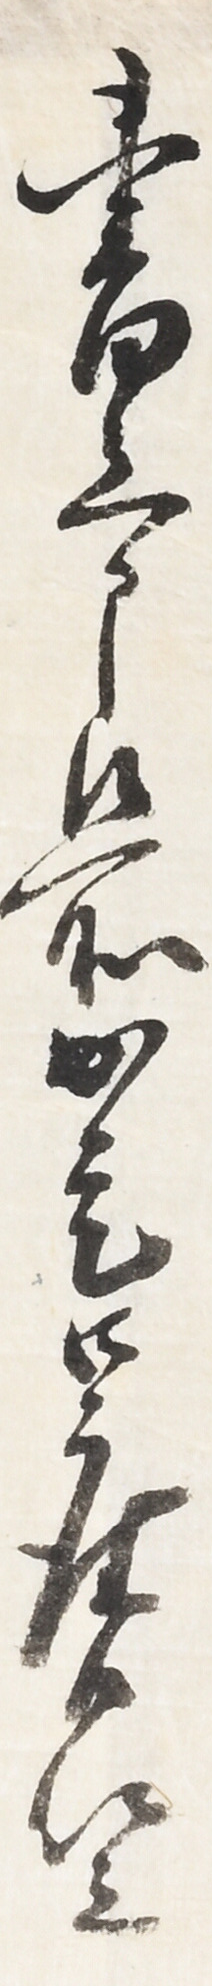書上申候所如是御座候以上
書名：旅人泊控帳
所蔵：伊那市立高遠町図書館・合同会社AMANE
